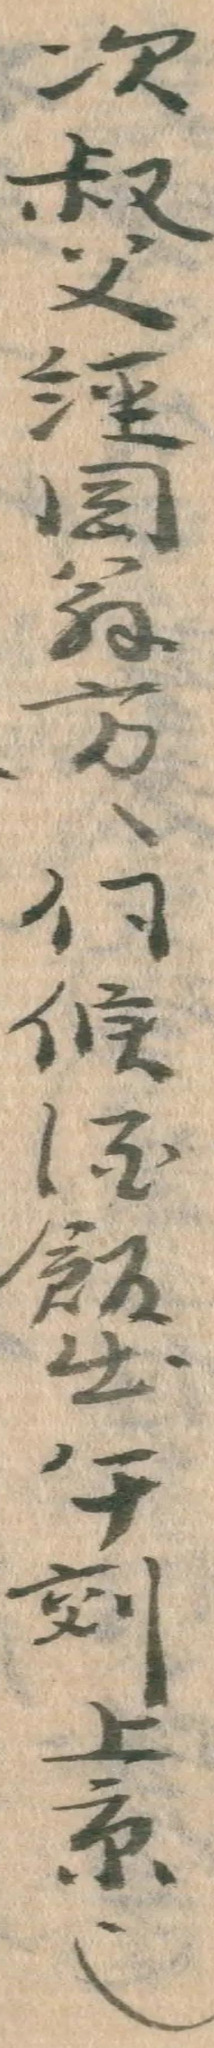次叔父経岡翁方へ伺候、酒飯出、午刻上京也、
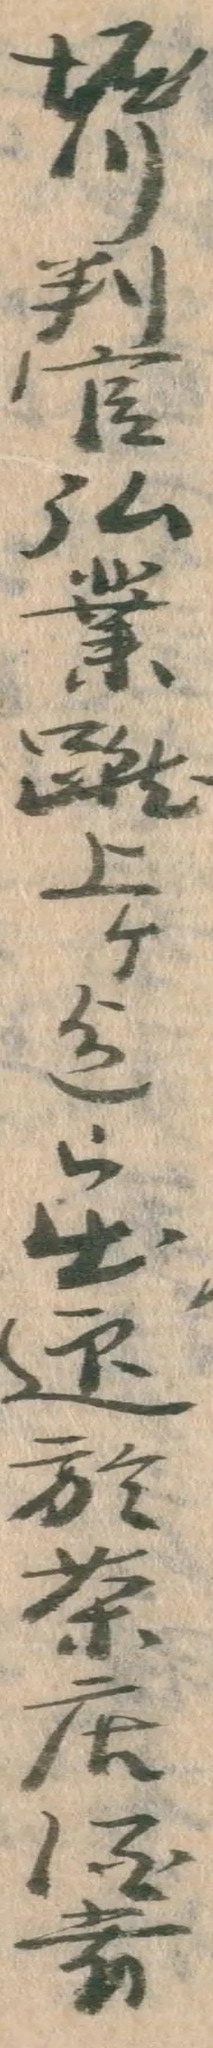堀川判官弘業蹴上ケ迄被出迎、於茶店酒肴
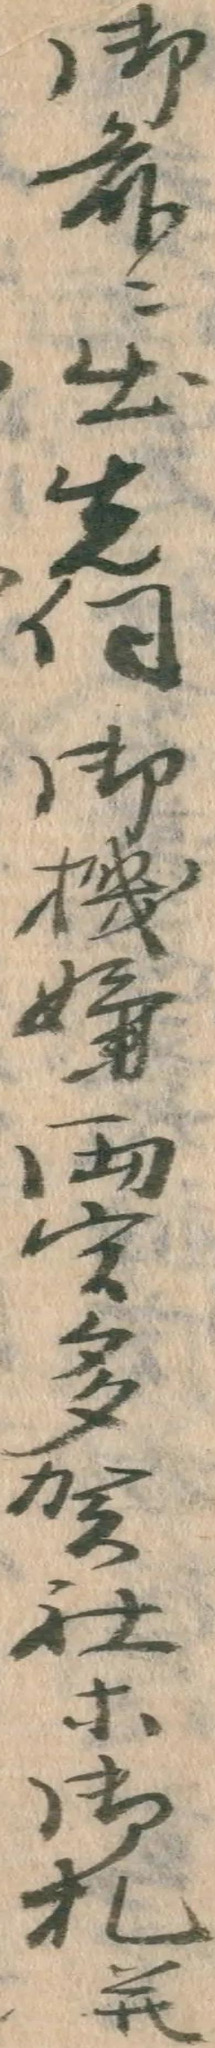御前二出、先伺御機嫌、両宮・多賀社等御札并
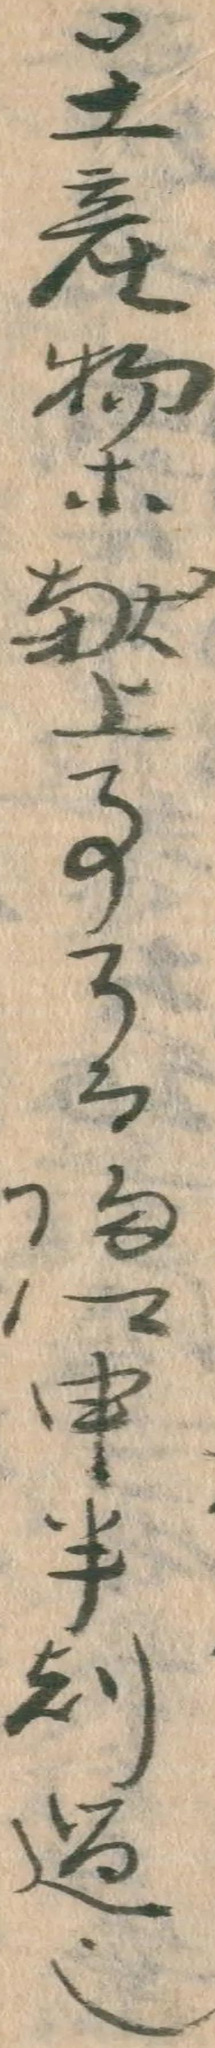御土産物等献上事了而帰候、申半刻過也、
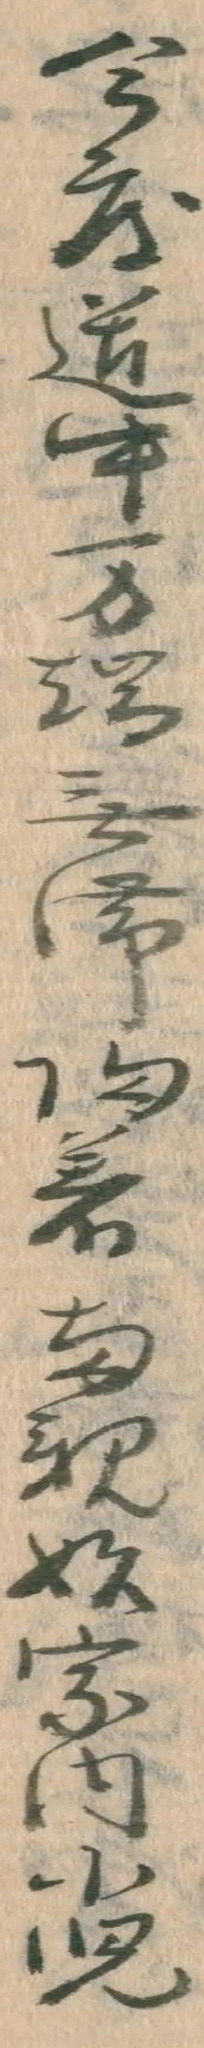今度道中万端無滞当着、両親始、家内・小児
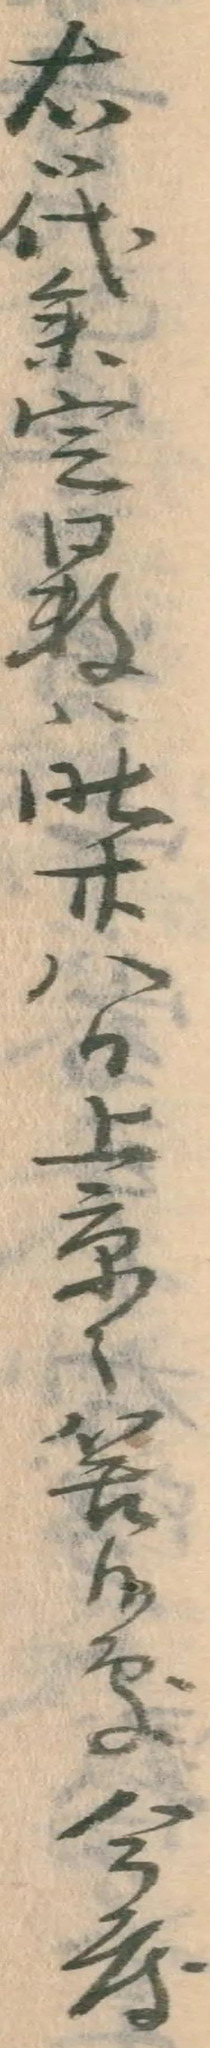右御代参、定日数は昨廿八日上京之筈候處、今度
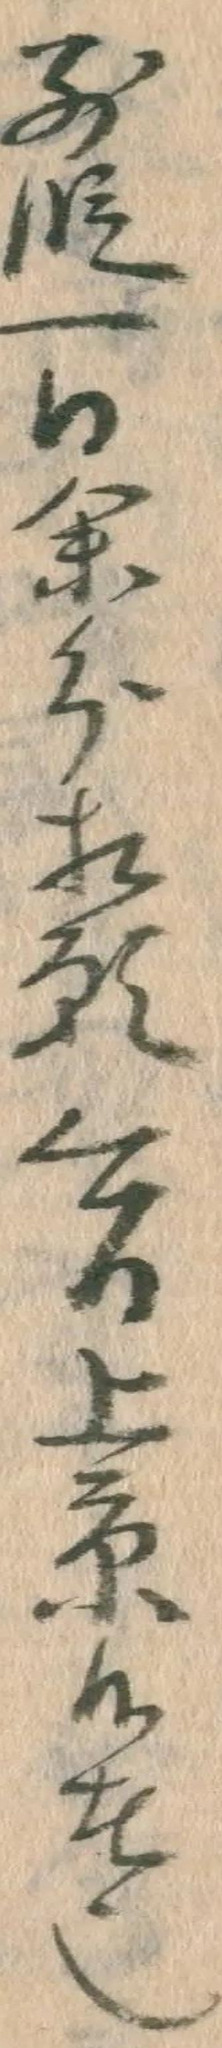別段一日余分相願、今日上京候者也、
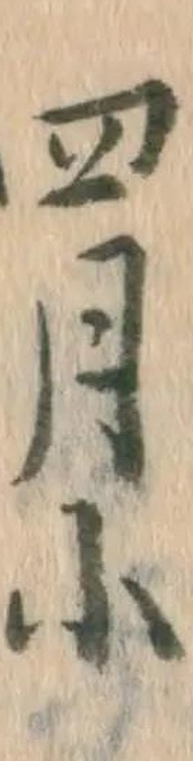四月小
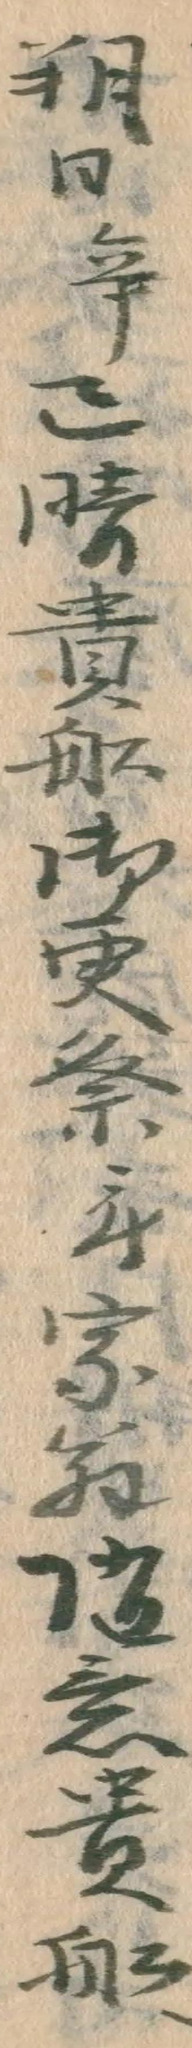朔日辛巳晴、責舩御更祭ニ付、家翁随意貴船へ
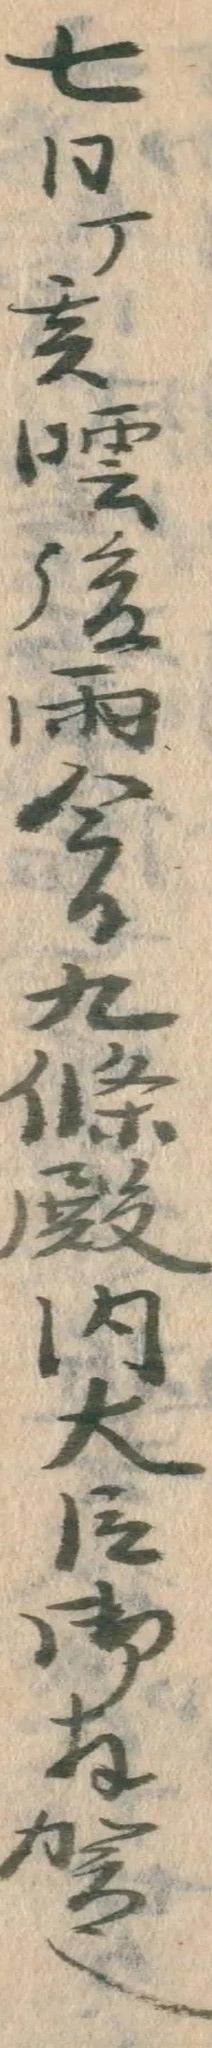七日丁亥雲後雨、今日九條殿内大臣御拝賀也、
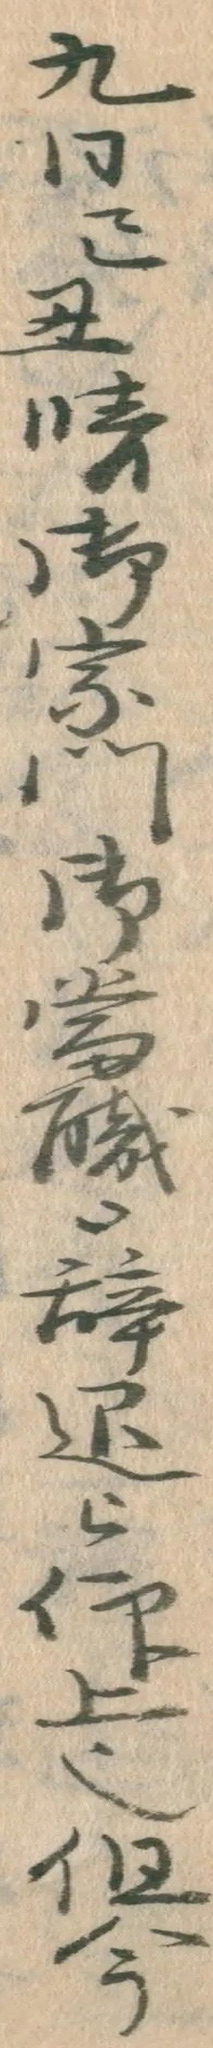九日己丑晴、御家門御當職御辞退被仰上也、但今
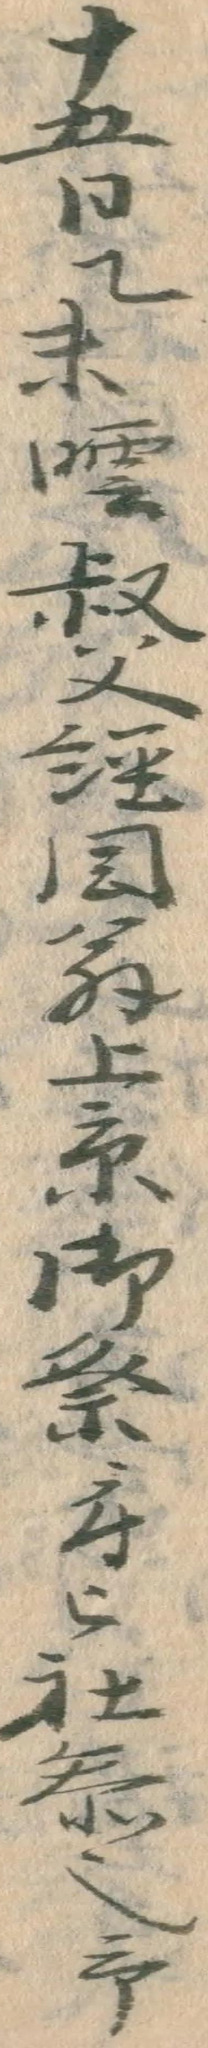十五日乙未雲、叔父経岡翁上京、御祭ニ付被社参也、予
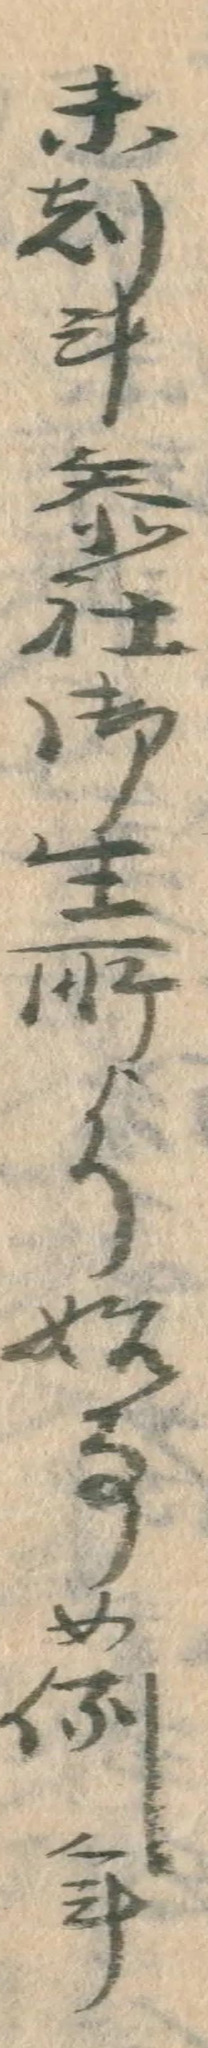未刻斗参社、御生所より始事如例年、
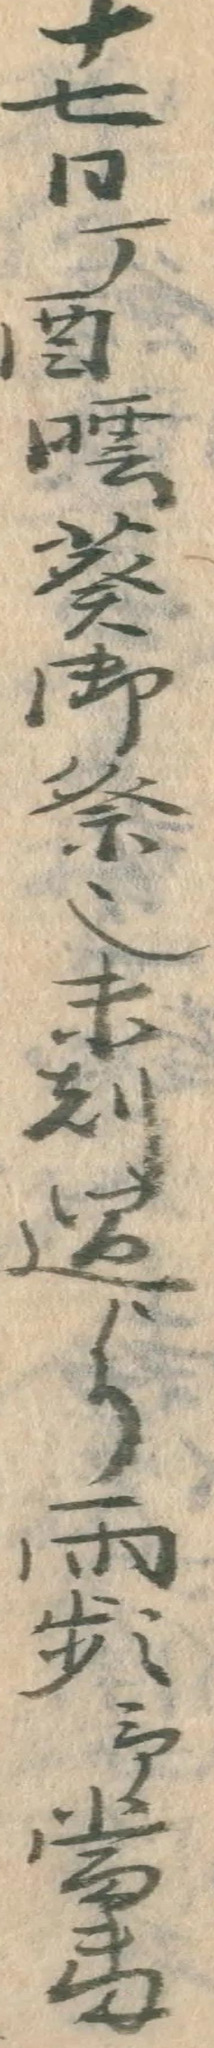十七日丁酉曇、葵御祭也、未刻過より雨頻ニ而當番
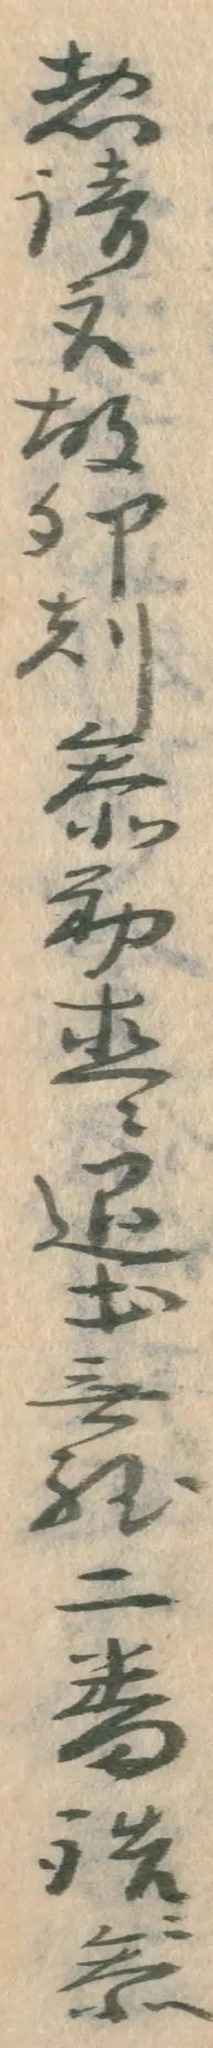惣請取故、卯刻参勤、直ニ退出、無程二番詰ニ参

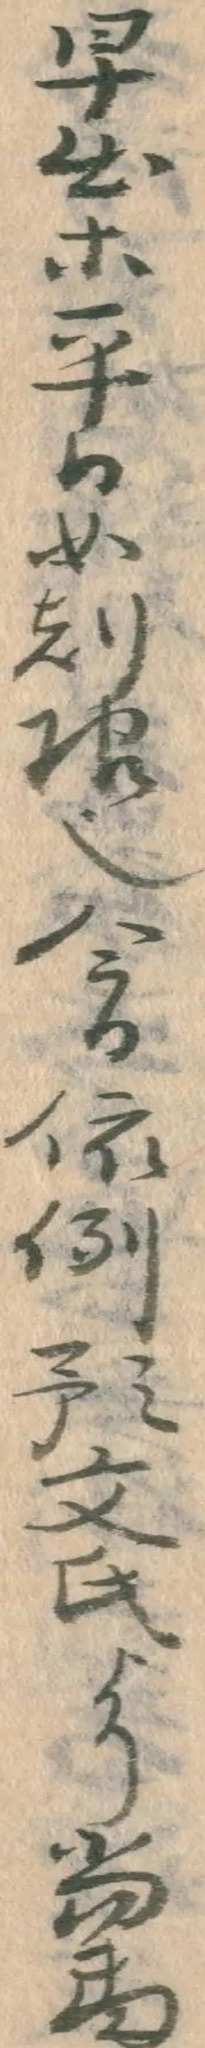早出等平日如刻限也、今日依例預文氏より當番
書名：賀茂社記録. 第63冊
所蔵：国立国会図書館 National Diet Library, JAPAN
